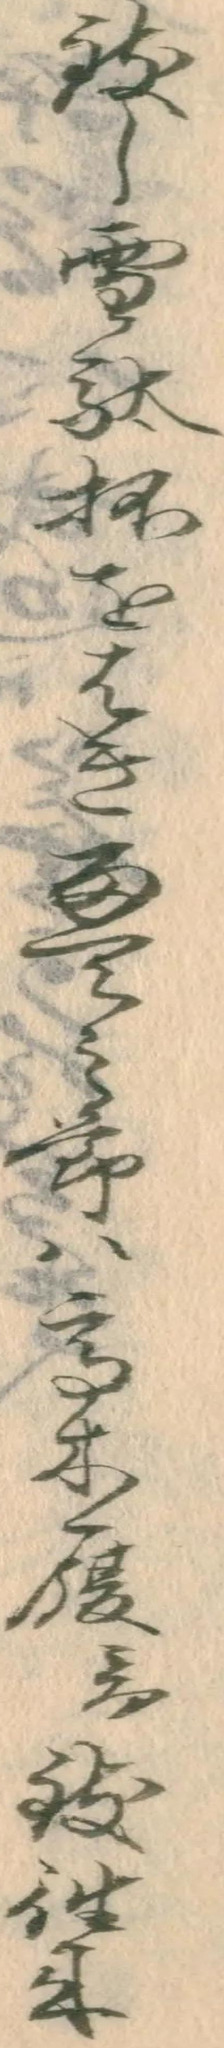致し雪駄抔をはき雨天之節ハ高木履ニ而致往来
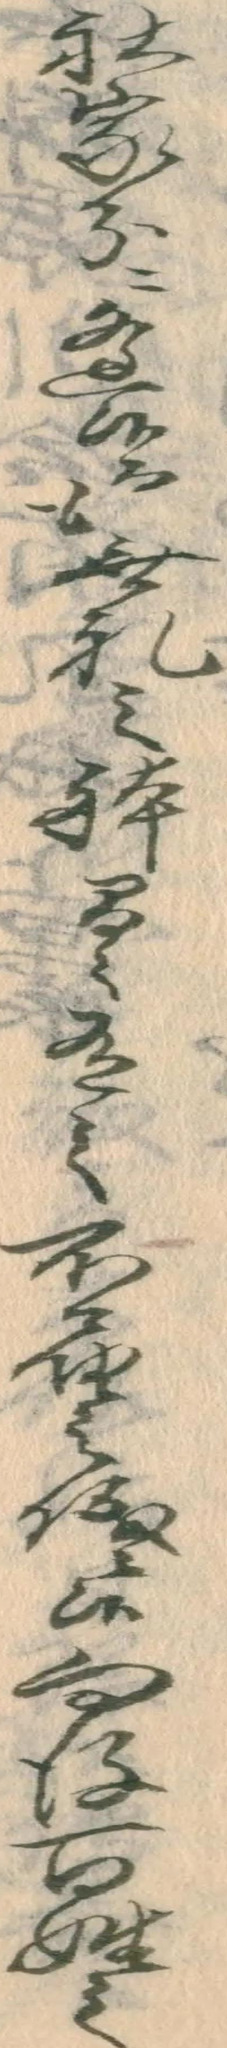社家分ニ逢候而も無礼之体間々有之不届之儀ニ候向後百姓之
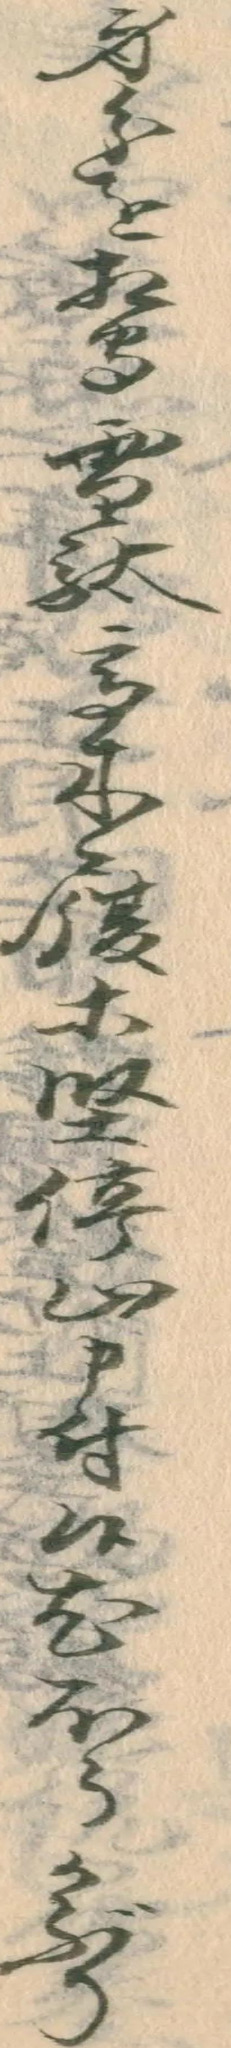身分を相守雪駄高木履等堅停止申付候尤ほうかぶり
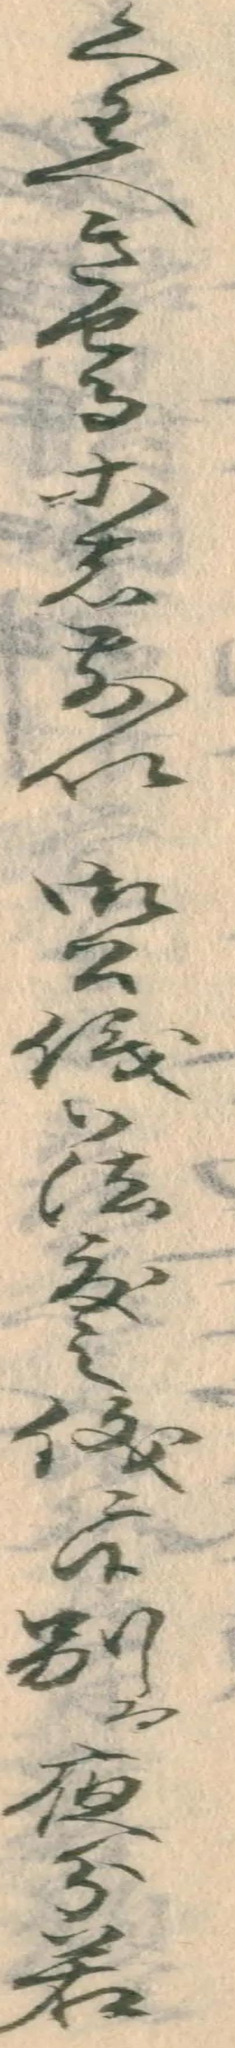くわへきせる等は前以御公儀御法度之儀ニ候別而夜分若
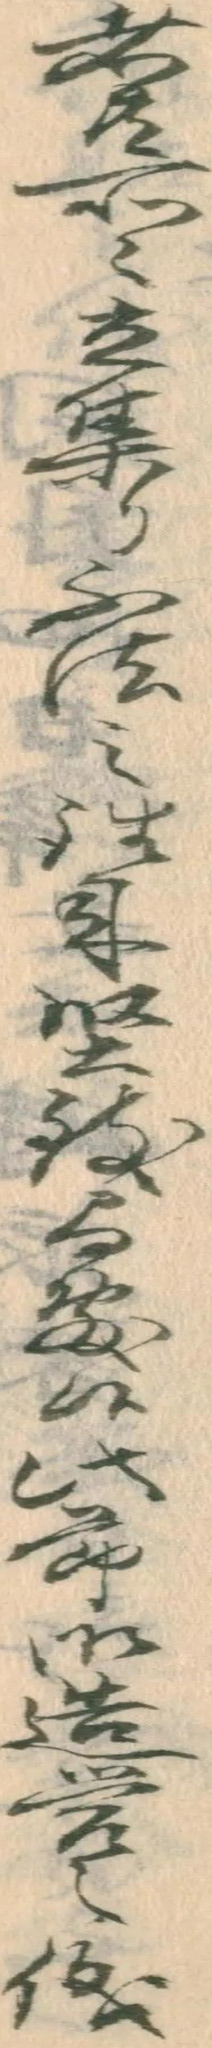者共所々立集り不法之往来堅致間敷候此節御造営之儀
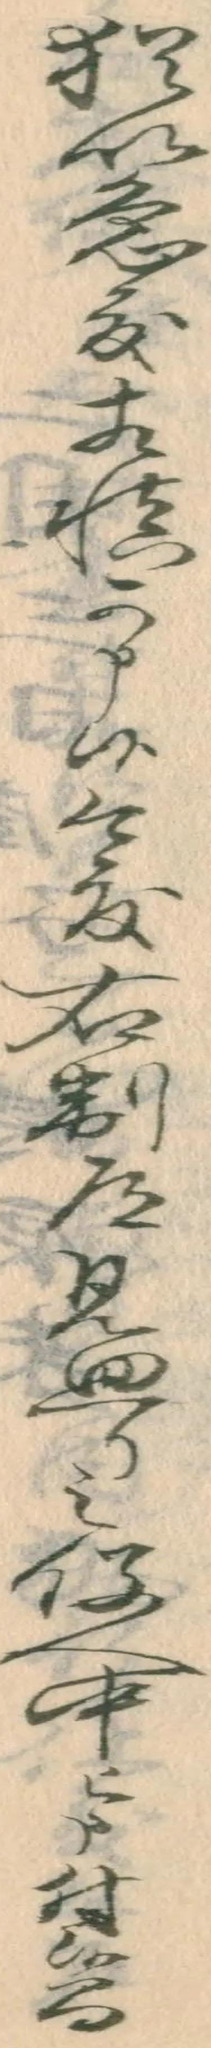猶以急度相慎可申候今度右制道見廻り之役人中被申付候間
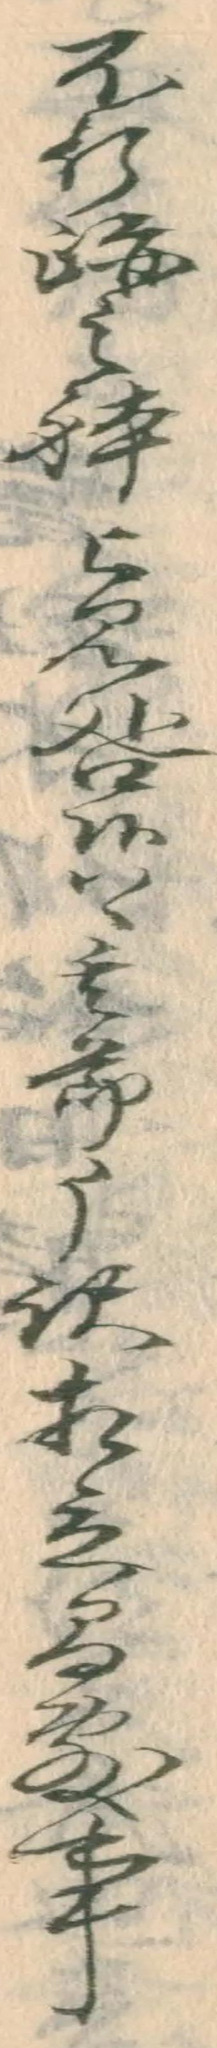不行跡之体被見咎候ハヽ其節申訳相立間敷事
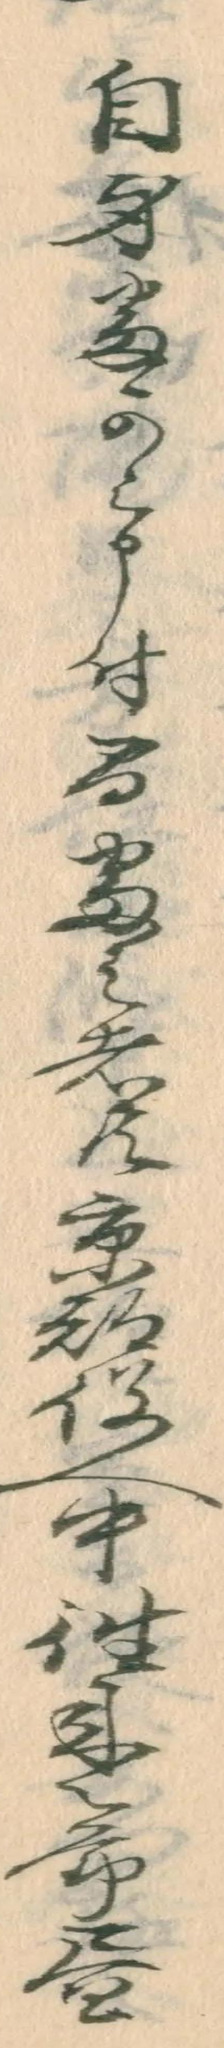一自身番可被申付間番之者共京都役人中往来之節昼
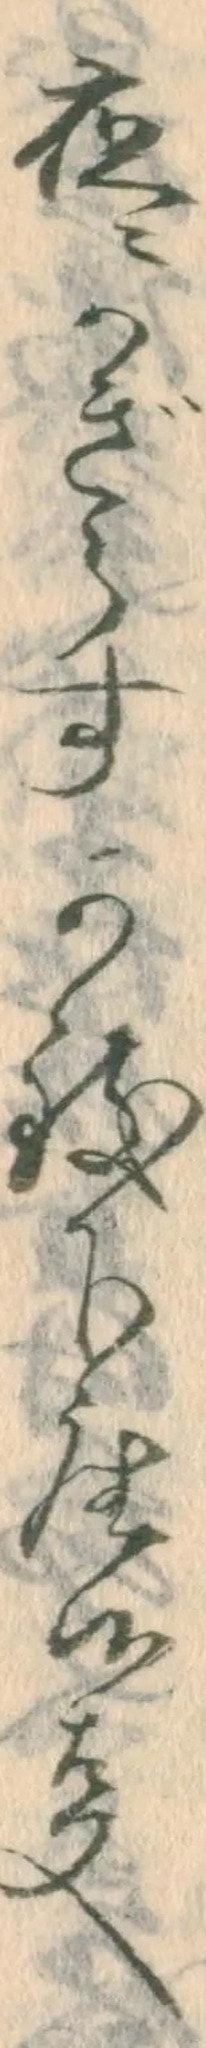夜ニかぎらす可致下座候事
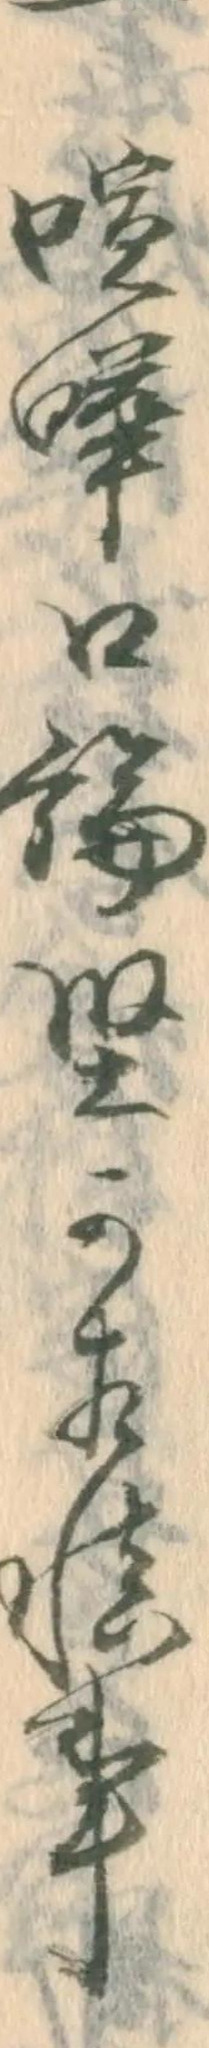一喧嘩口論堅可相慎事
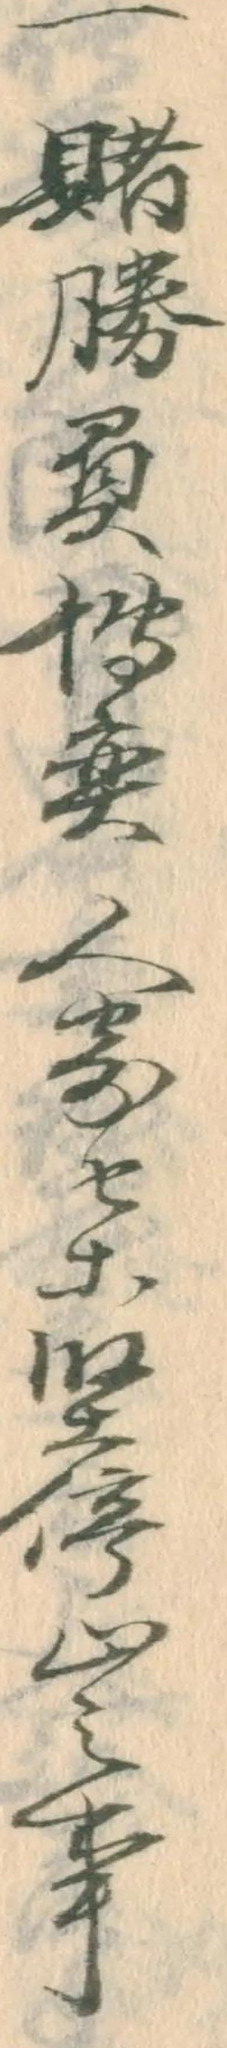一賭勝負博奕人寄セ等堅停止之事
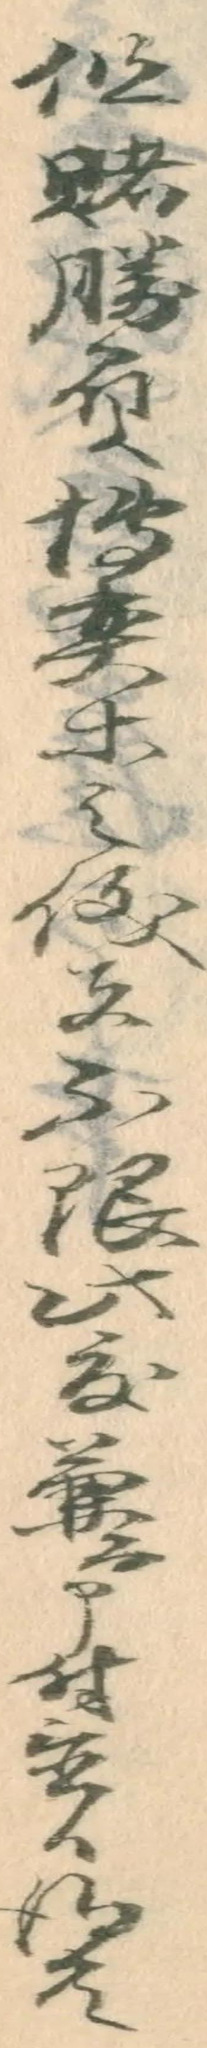但賭勝負博奕等之儀は不限此度兼而申付置候得共

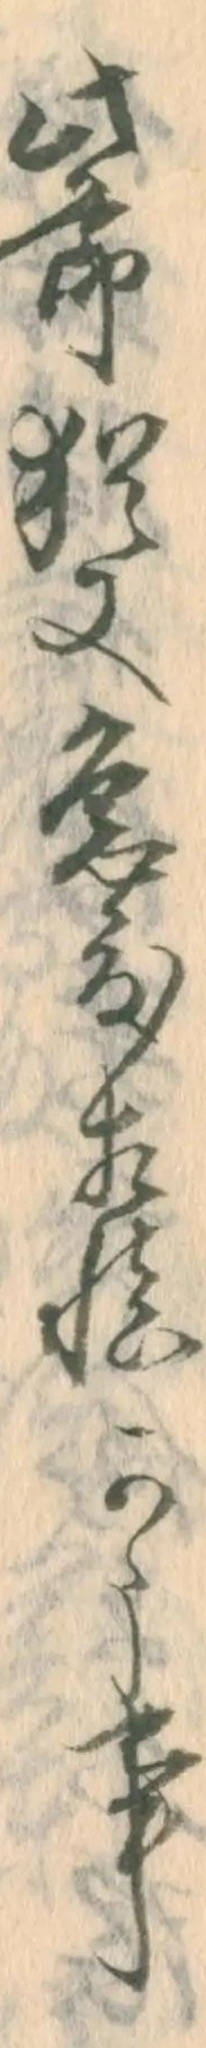此節猶又急度相慎可申事
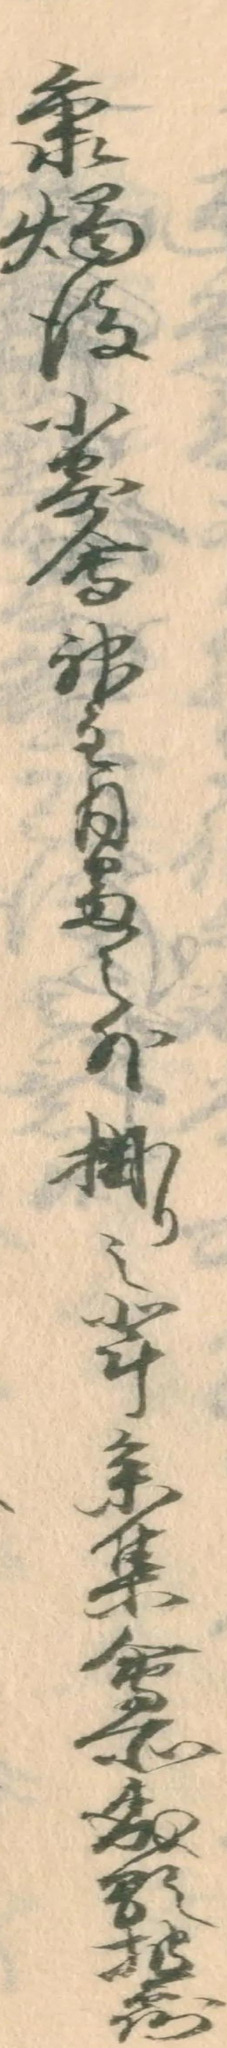一秉燭後小寄会神主月番之外掛り之輩参集会所森顕披露
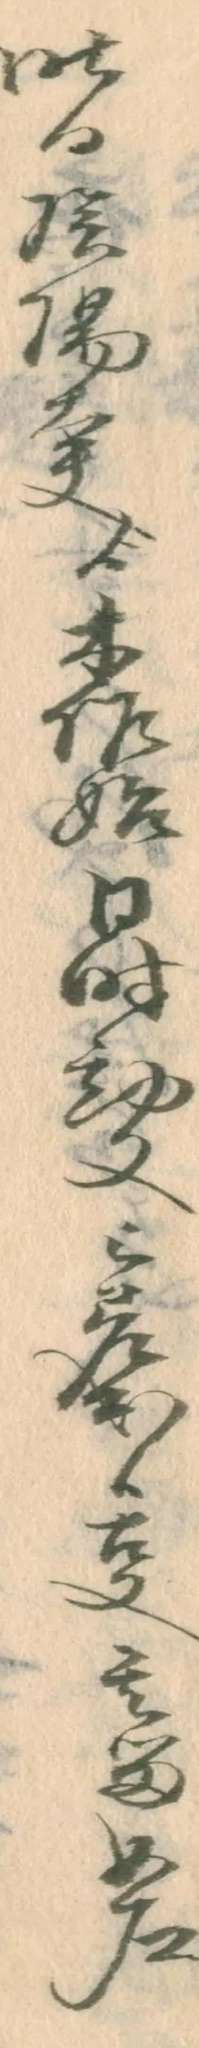昨日陰陽大夫ゟ木作始日時勘文被差出候事其留如左
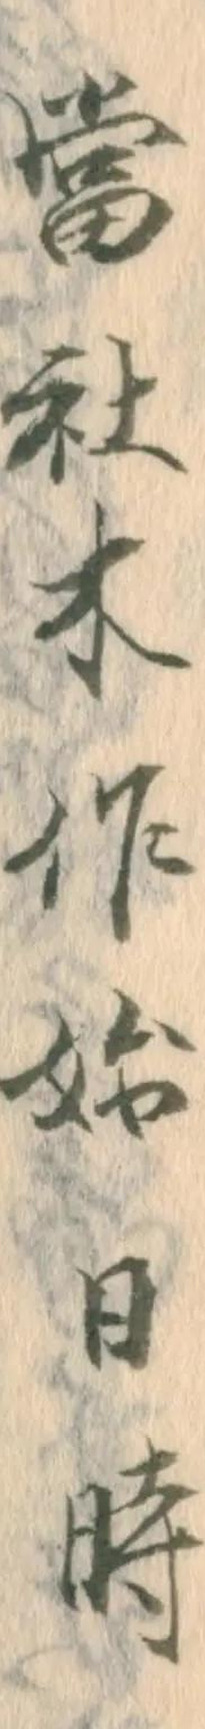当社木作始日時
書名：賀茂社記録. 第17冊
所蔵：国立国会図書館 National Diet Library, JAPAN
